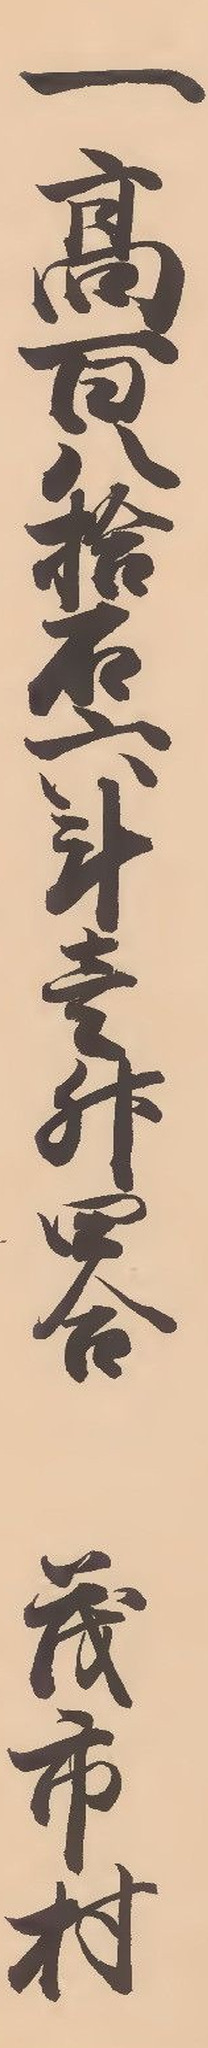一高百八拾石六斗壱升四合茂市村
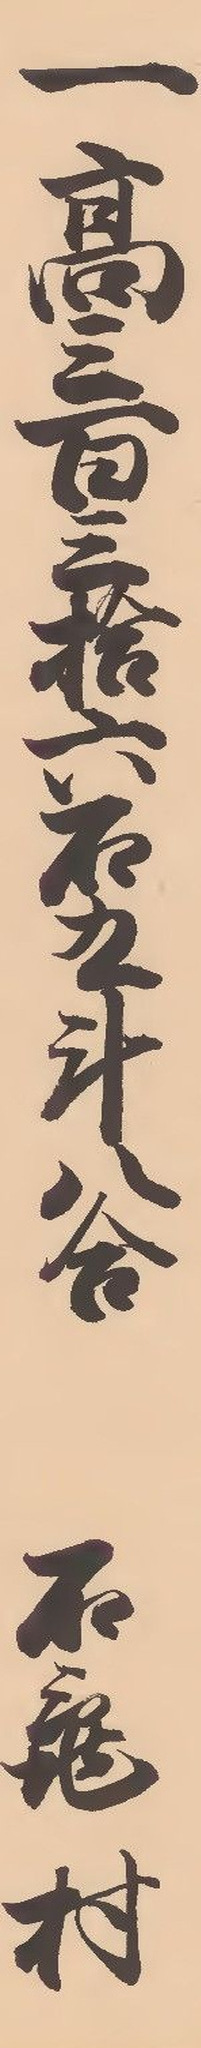一高三百三拾六石九斗八合石亀村
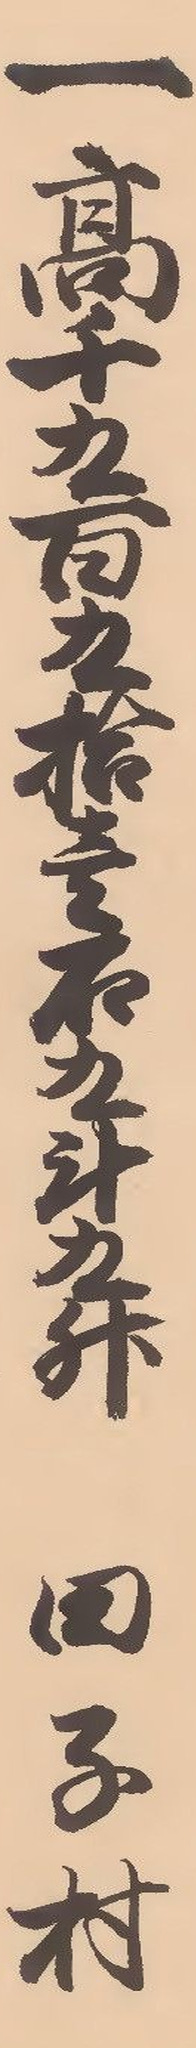一高千九百九拾壱石九斗九升田子村
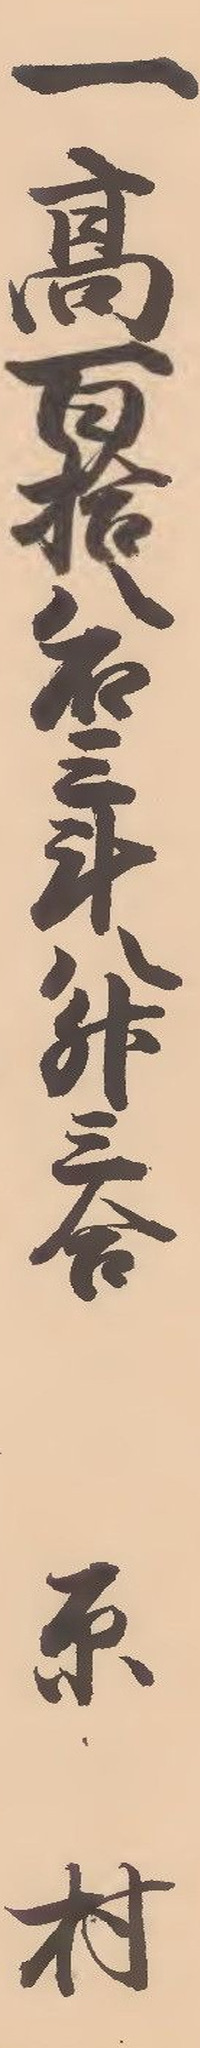一高百拾八石三斗八升三合原村
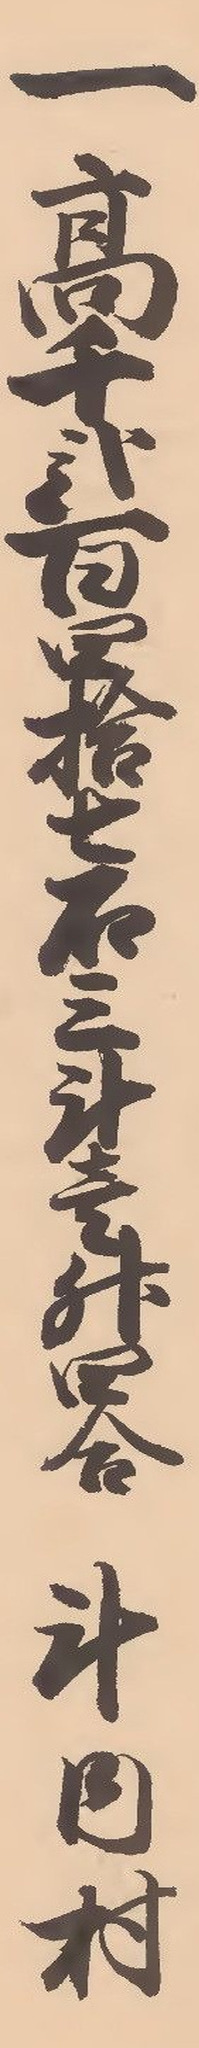一高千弐百四拾七石三斗壱升四合斗内村
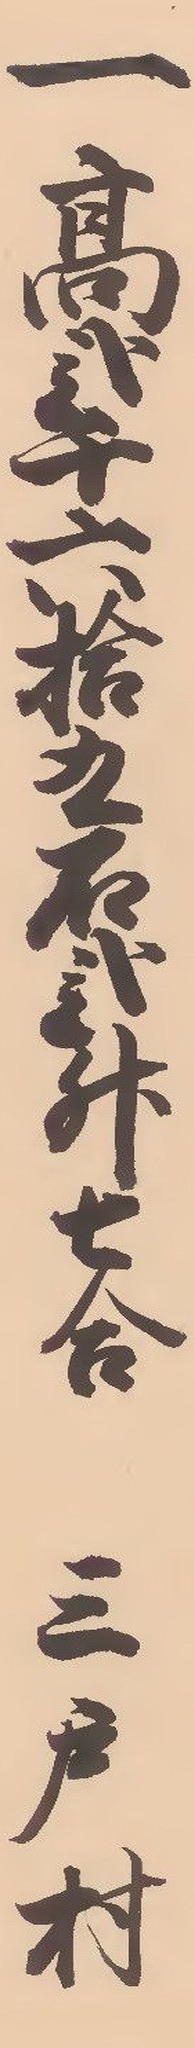一高弐千六拾九石弐升七合三戸村

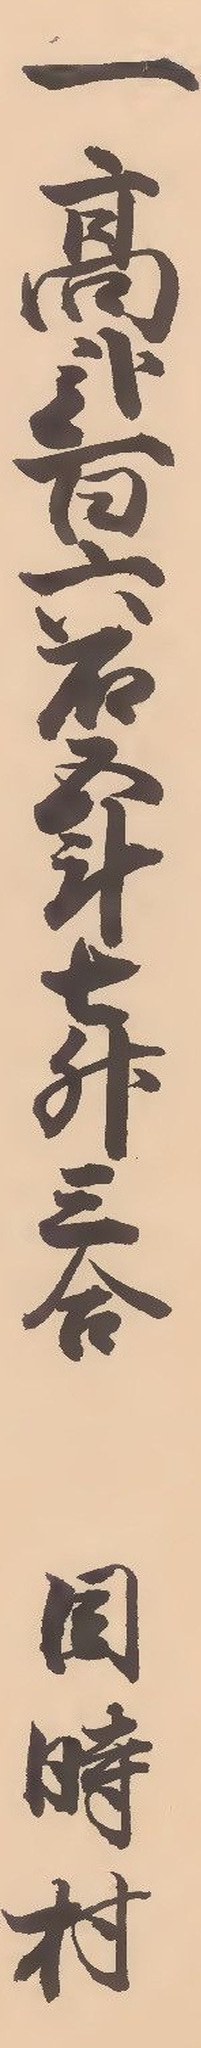一高弐百六石五斗七升三合目時村
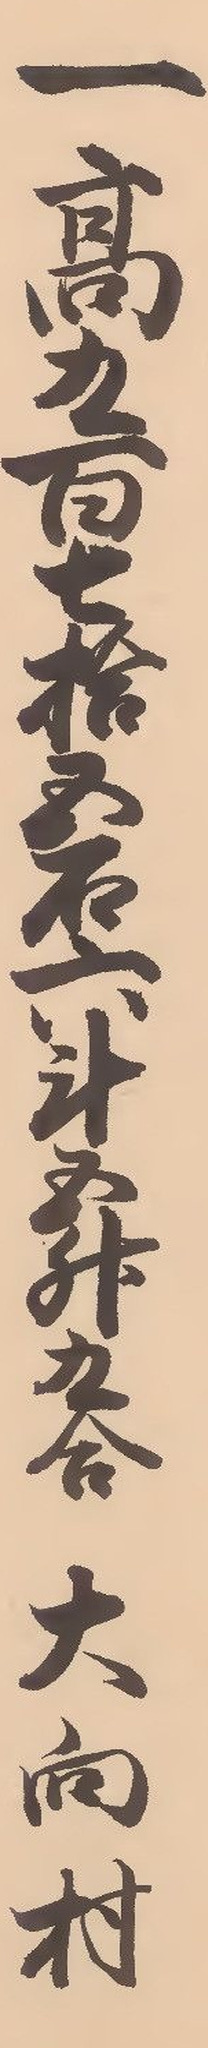一高九百七拾五石六斗五升九合大向村
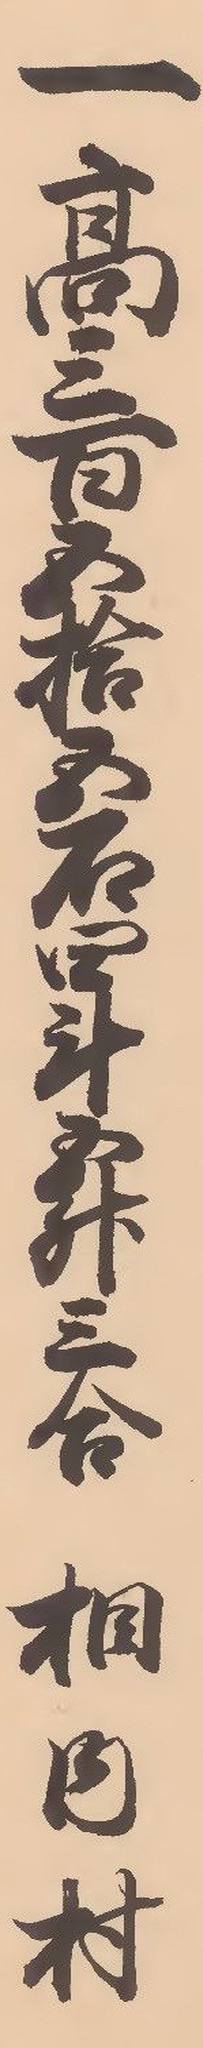一高三百五拾五石四斗五升三合相内村
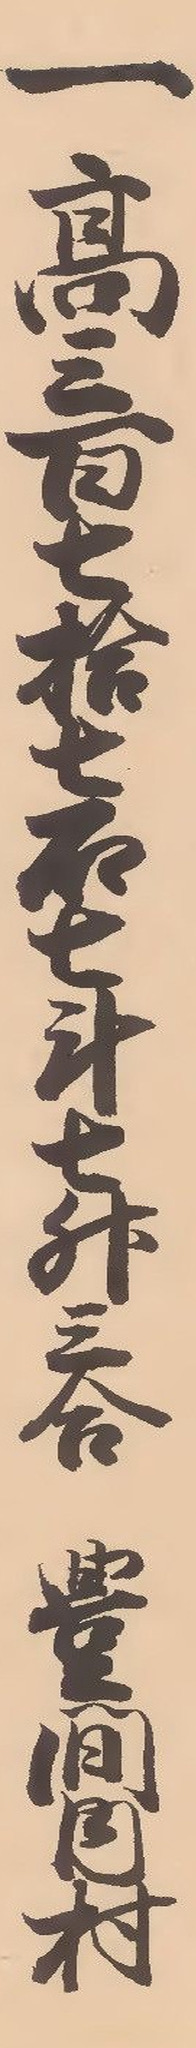一高三百七拾七石七斗七升三合豊間内村
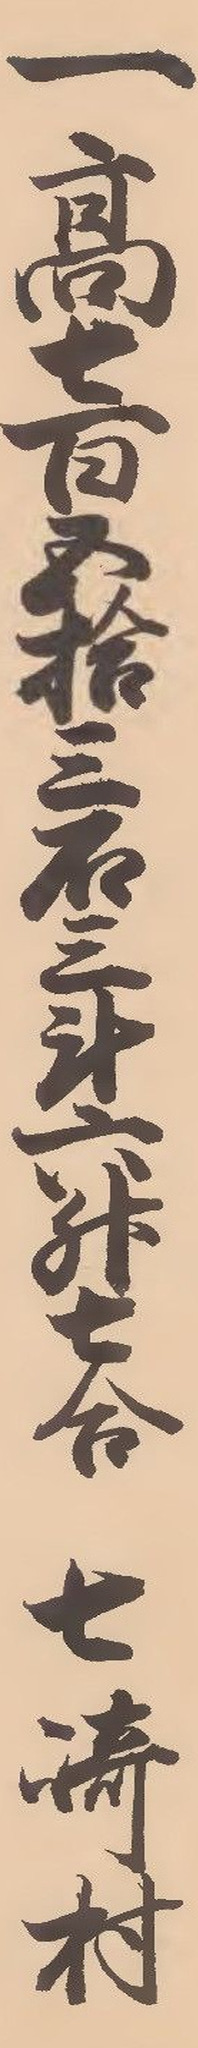一高七百五拾三石三斗六升七合七崎村
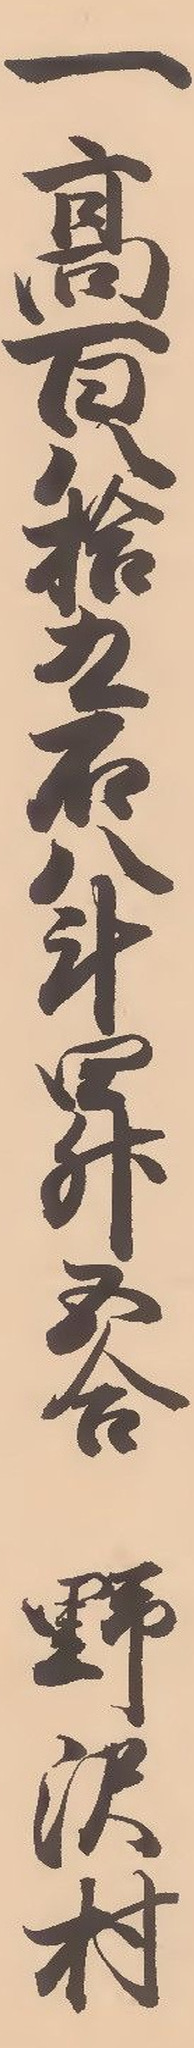一高百八拾九石八斗四升五合野沢村
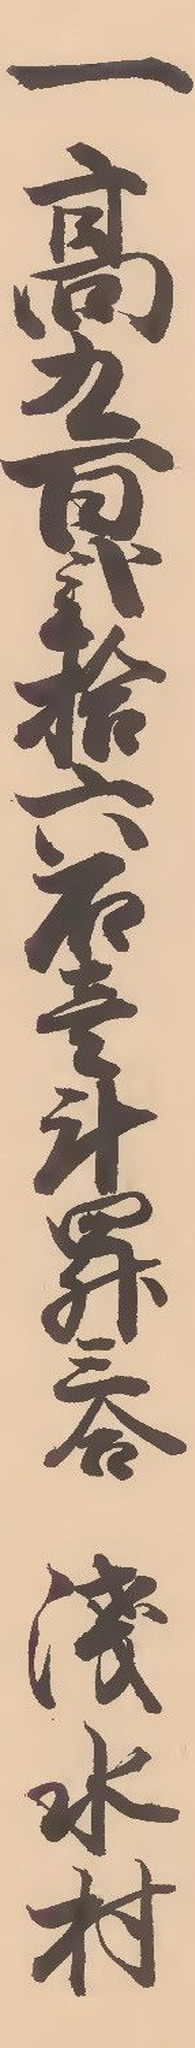一高九百弐拾六石壱斗四升三合浅水村

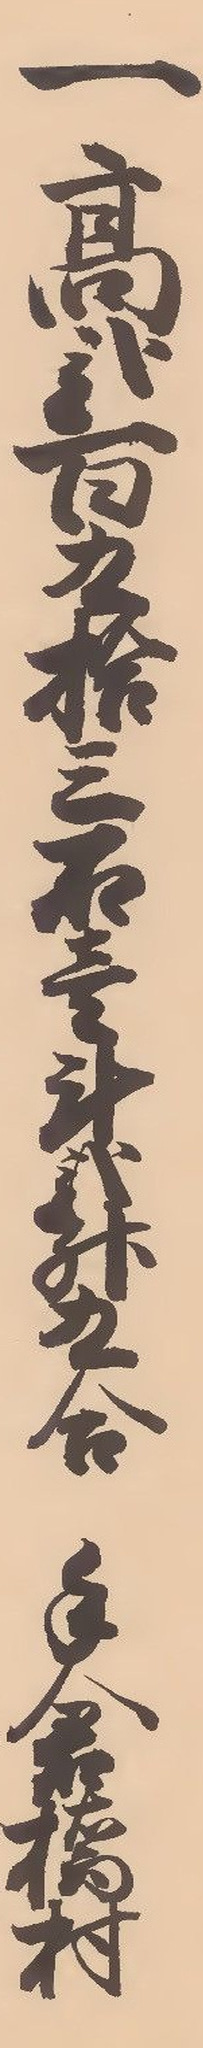一高弐百九拾三石壱斗弐升九合手倉橋村
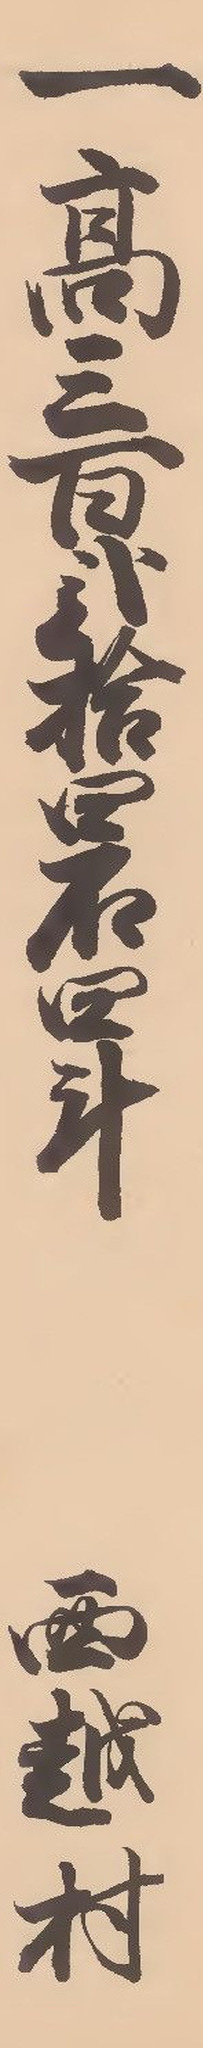一高三百弐拾四石四斗西越村
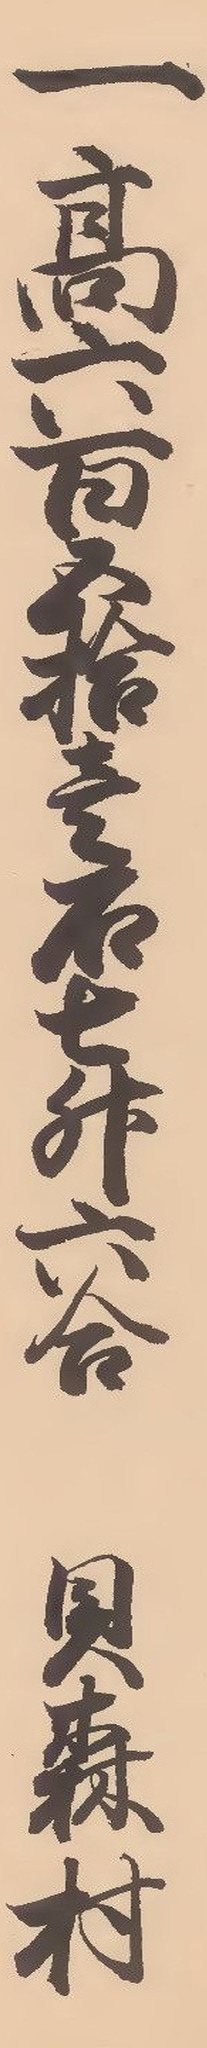一高六百五拾壱石七升六合貝森村
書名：陸奥国郷帳　６
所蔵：国立公文書館 National Archives of Japan
